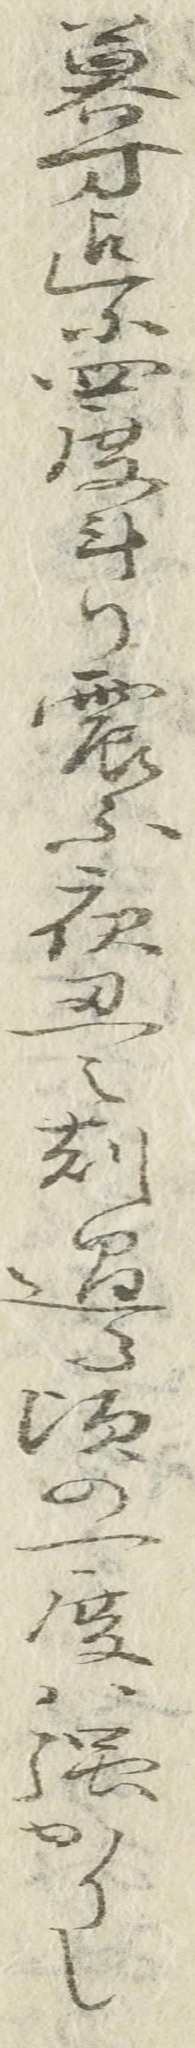暮方迄に四度斗り震ふ夜丑之刻過る頃の一度ハ強かりし
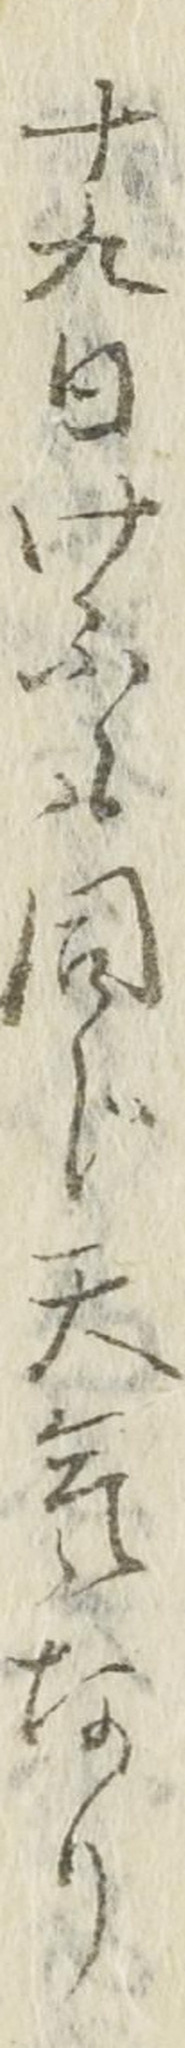十九日けふも同じ天気なり
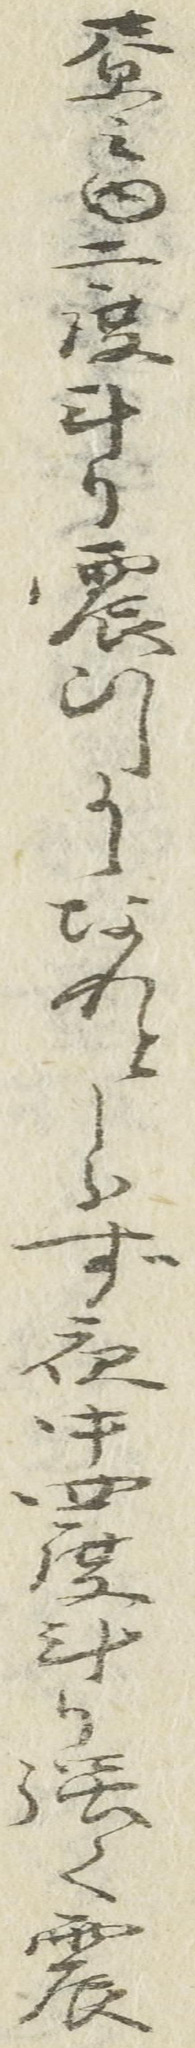昼之内二度斗り震ひしよしなれとしらず夜中四度斗り強く震
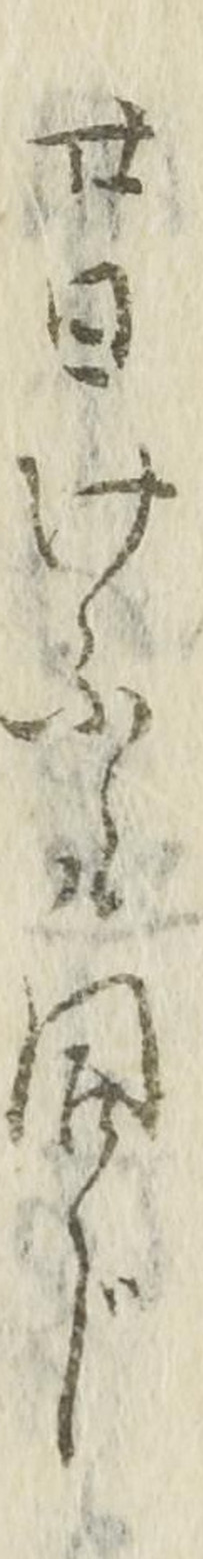廿日けふも同じ
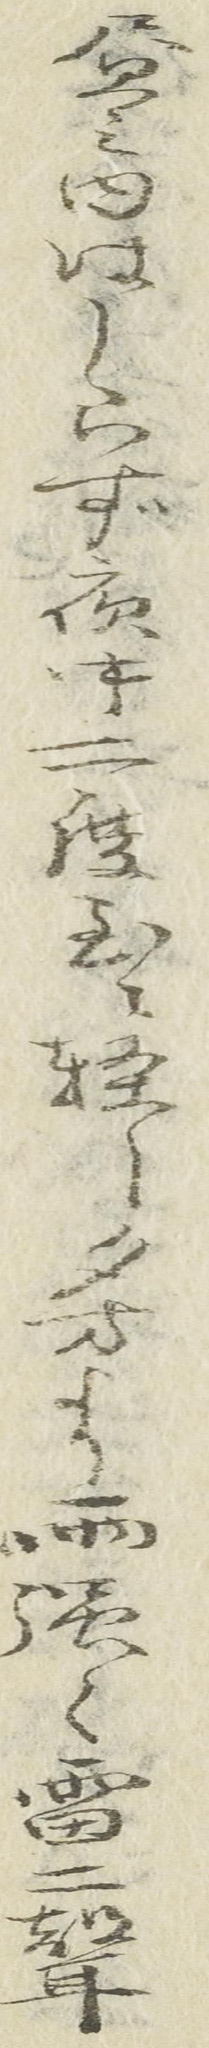昼之内はしらず夜中二度至て軽し夕方より雨強く雷二声
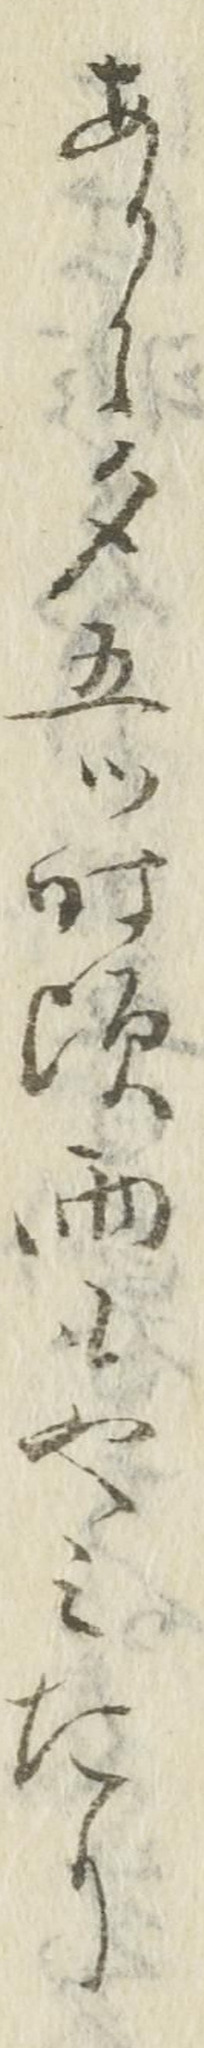ありし夕五ツ時頃雨もやミたり
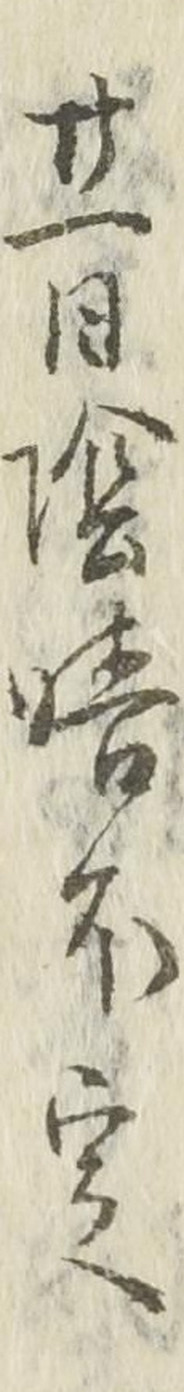廿一日陰晴不定
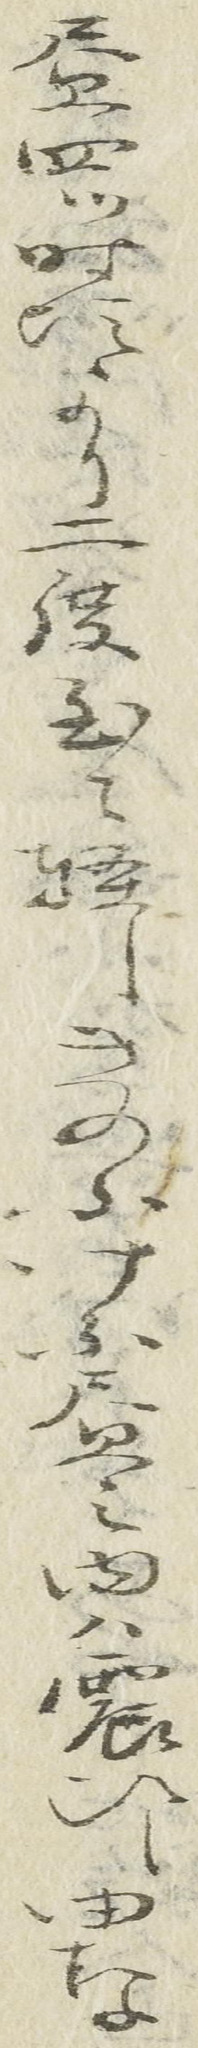昼四ツ時頃より二度至て軽しきのふけふ昼之内ハ震ひし由な
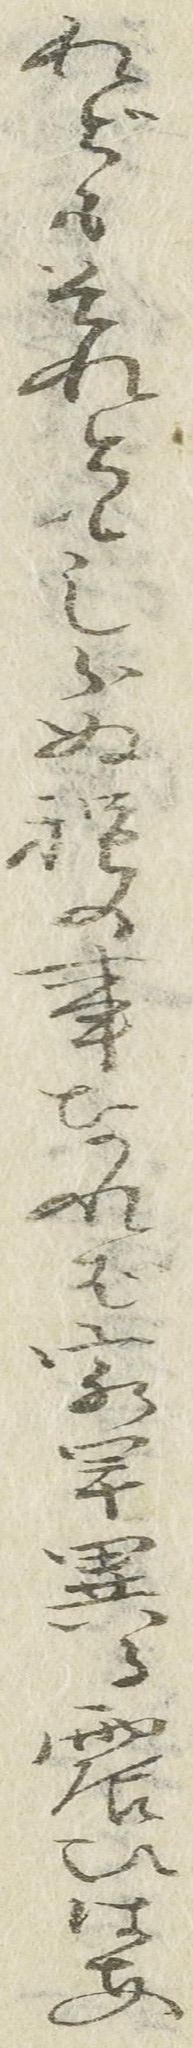れどもそれともしらぬ程の事なれば最早異る震ひはあ
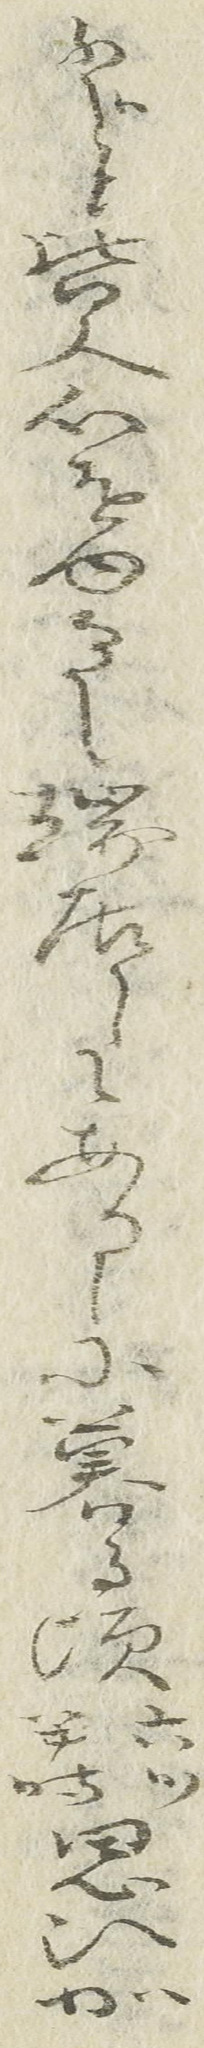らじと皆人心をゆるし端居してありしに暮る頃六ツ半時思ひか
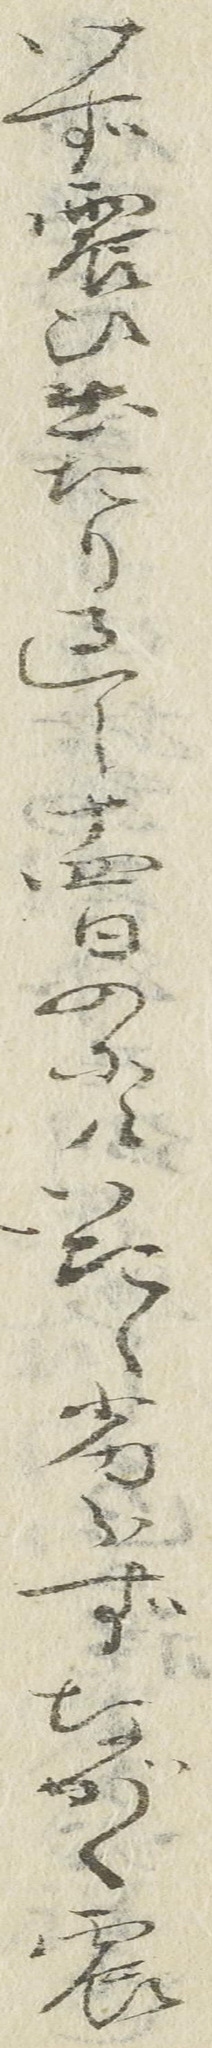けず震ひ出たり過し十四日のにハいたく劣らずながく震
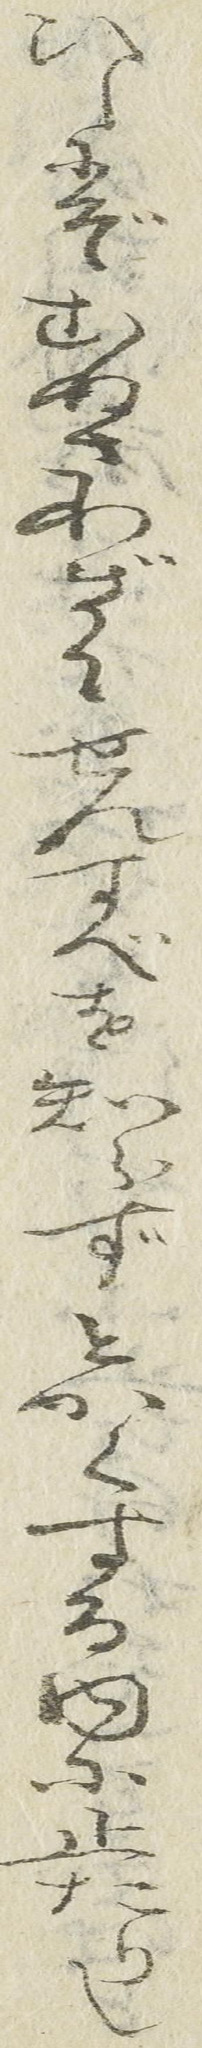ひしにぞむねさわぎてせんすべを知らずとかくする内に止たりし
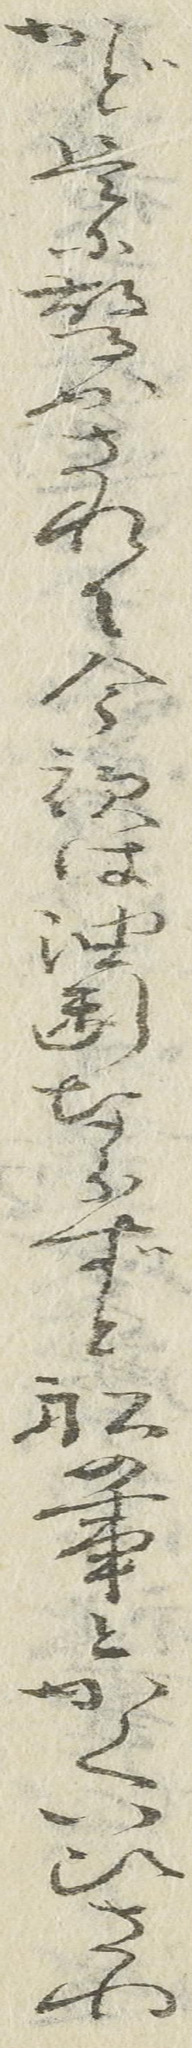かど是に驚かされて今夜は油断ならずと船の事とかくいひさわ
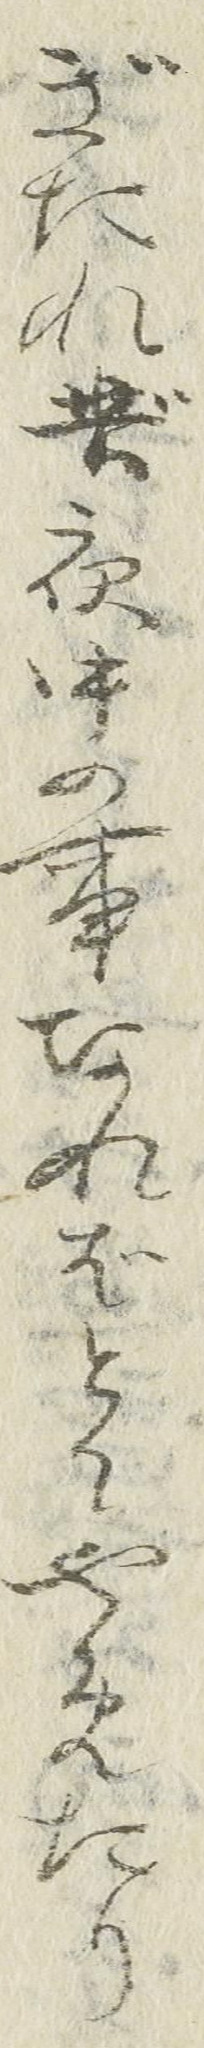ぎたれ共夜中の事なればとてやめたり
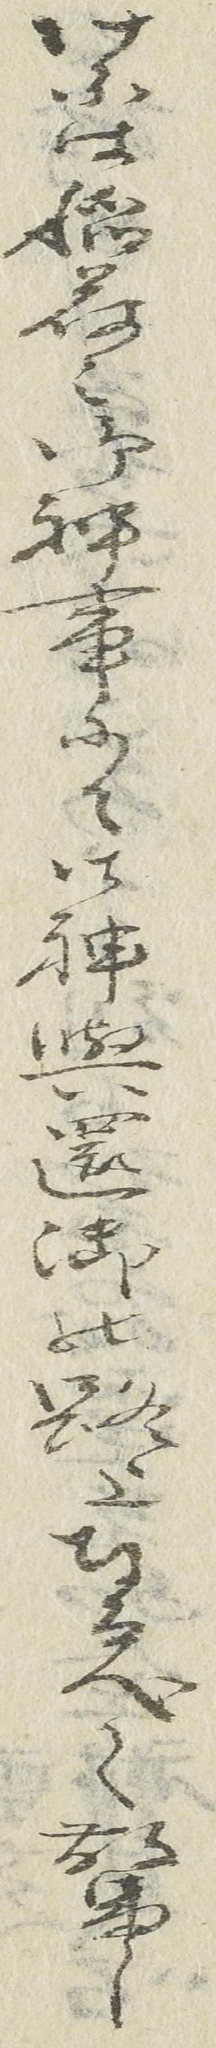けふは稲荷之御神事にて御神輿還御の路上なるべく驚し
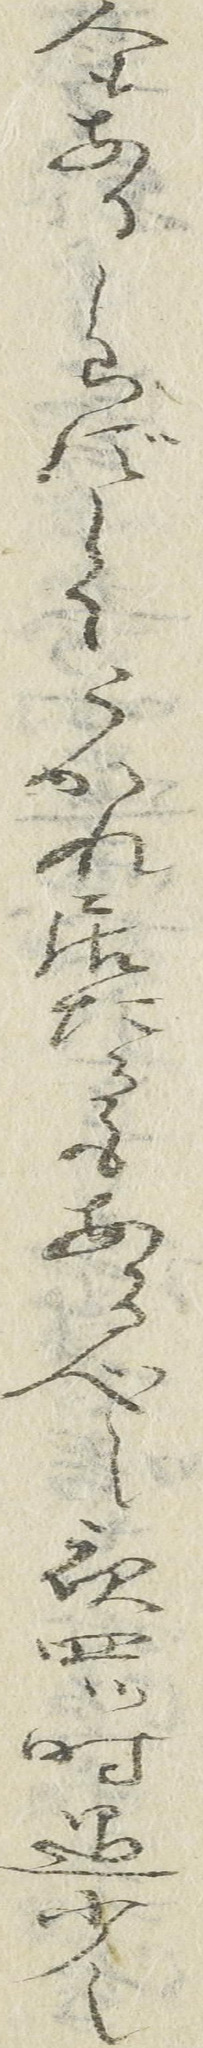人もありしらずしてうかれ居たるもあるべし夜四ツ時過少し
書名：地震前兆集　全
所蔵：東京大学地震研究所図書室 Earthquake Research Institute Library, The University of Tokyo, JAPAN
